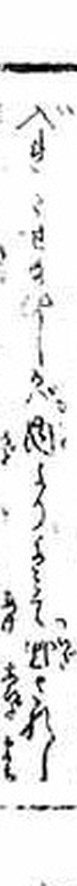入れこせ給しかば内よりよみて出されし道綱
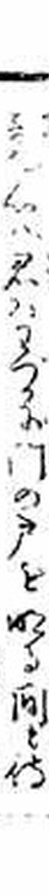哥也心はわづかに門の戸を明る間と待母
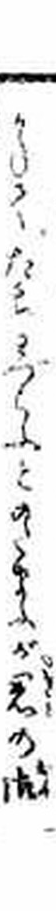かねてたちわづらふとのたまふが君の御
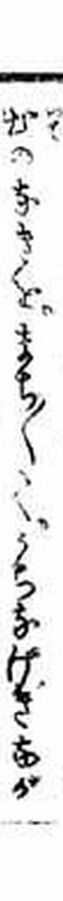出のなきをまち〳〵てうちなげきが
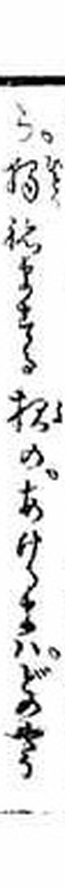ら独ねまする夜のあけるまはどのやう
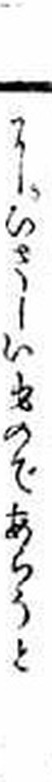にひさしいものであらうと
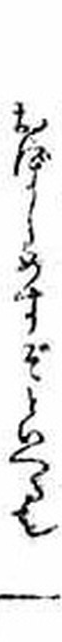おぼしめすぞといへる也

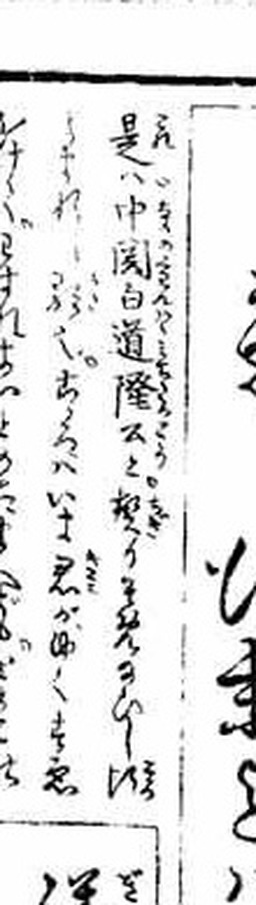是は中関白道隆公と契りそめ給ひし頃
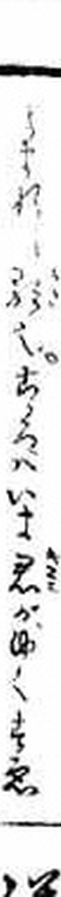よまれし歌也こゝろはいま君がゆくすゑ儀同
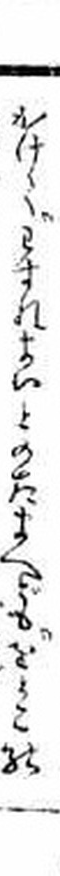かけてわすれまいとのたまへどもをとこの
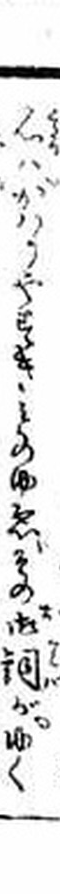心はかはりやすきものゆゑその御詞はゆく三司
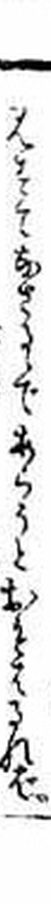みすてなさるゝであらうとおもはるれば母
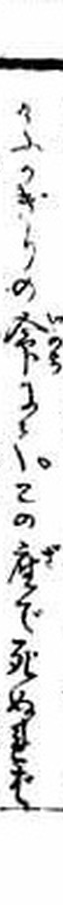けふかぎりの命にてこの座で死ぬれば
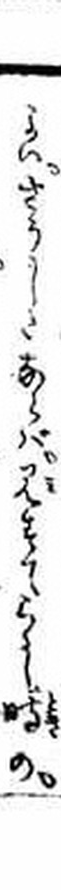よいさうしたならば見すてらるゝ時の
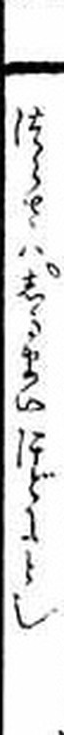つらさはしるまいほどにと也
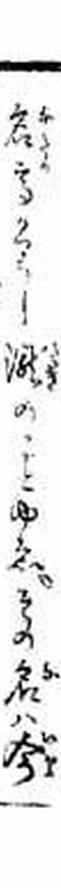名高かりし瀧のことゆゑその名は今言
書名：小倉百人一首
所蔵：東京学芸大学教育コンテンツアーカイブ
